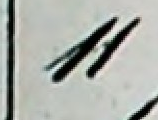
11
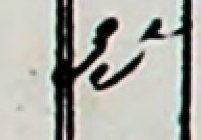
35
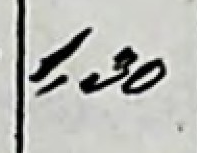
1,30
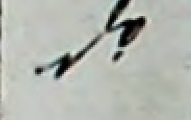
do
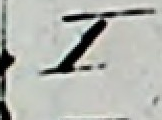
I
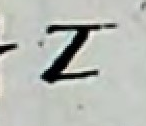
I
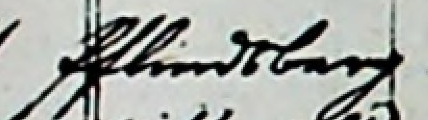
Pflindsberg
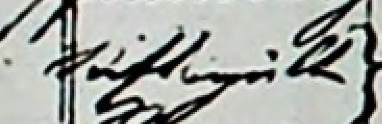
Stiftsgült
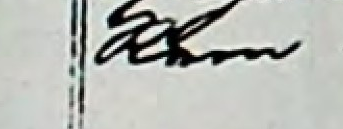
Rein
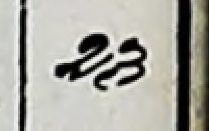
23
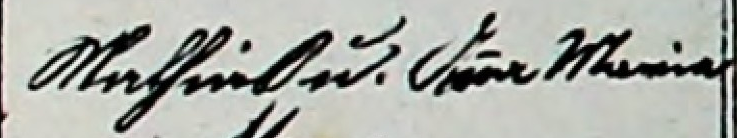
Mathias u. Anna Maria
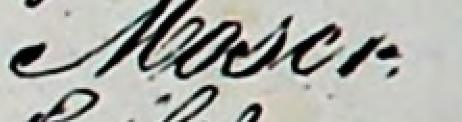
Moser
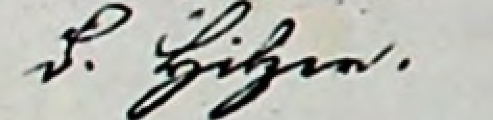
v. Hilzer.
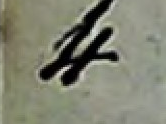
4
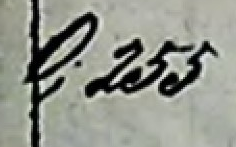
0,255
